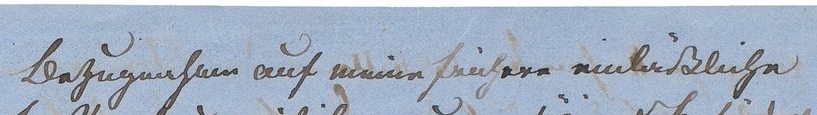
Bezugnahme auf meine frühere einläßliche
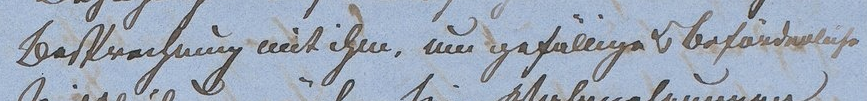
Besprechung mit ihm, um gefällige & beförderliche
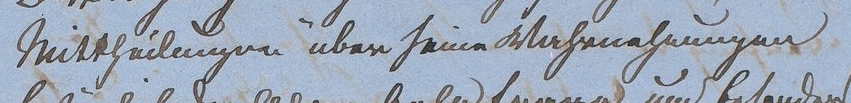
Mittheilungen über seine Wahrnehmungen
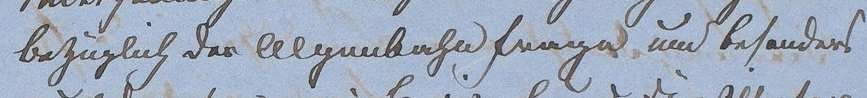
bezüglich der Alpenbahnfrage und besonders
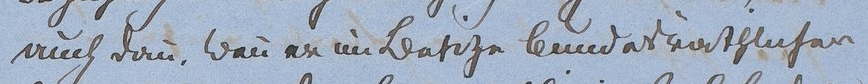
auch dann, wenn er im Besitze bundersräthlicher
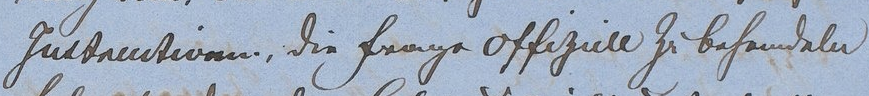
Instructionen, die Frage offiziell zu behandeln
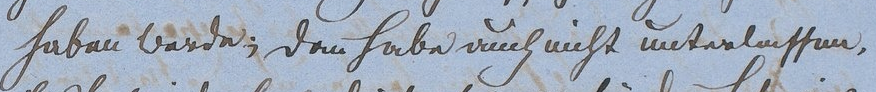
haben werde; dann habe auch nicht unterlassen,
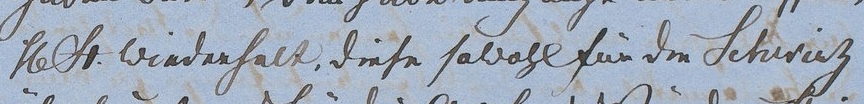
H. St. wiederholt diese sowohl für die Schweiz
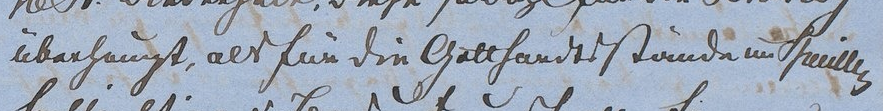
überhaupt, als für die Gotthardtsstände im Speciellen
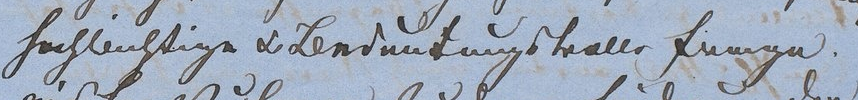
hochwichtige & bedeutungsvolle Frage
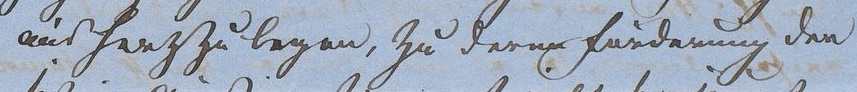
ans Herz zu legen, zu deren Förderung der
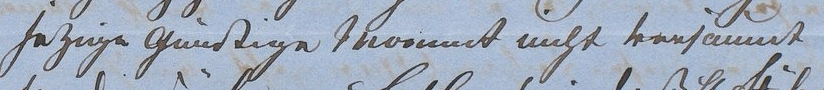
jezige günstige Moment nicht versäumt
